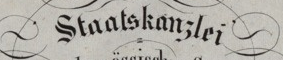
Staatskanzlei
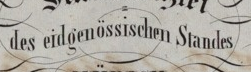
des eidgenössischen Standes
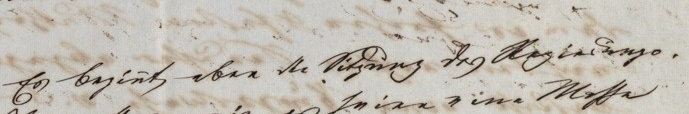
Es beginnt eben die Sitzung des Regierungs-
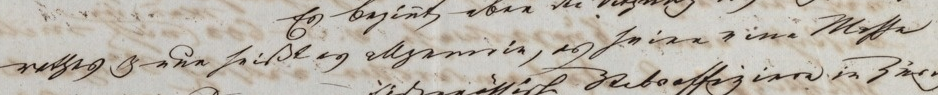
rathes & nun heißt es allgemein, es seien eine Masse
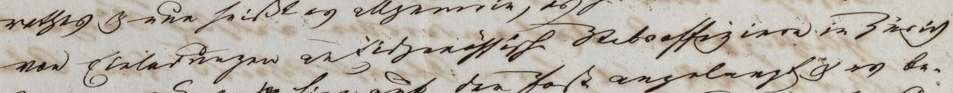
von Einladungen an Eidgenössische Stabsoffiziere in Zürich
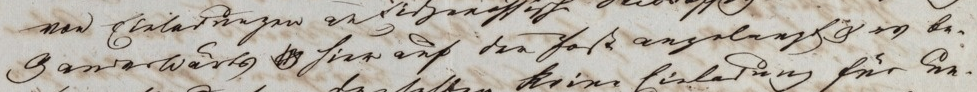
& anderwärts & hier auf der Post angelangt & es be-
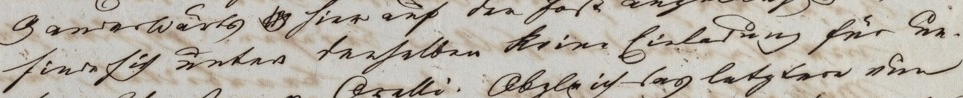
finde sich unter denselben keine Einladung für un-
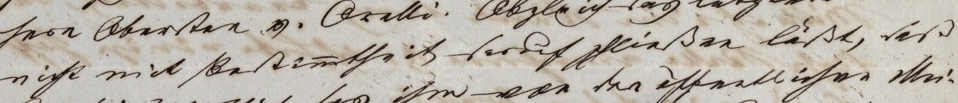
nicht mit Bestimmtheit darauf schließen läßt, daß
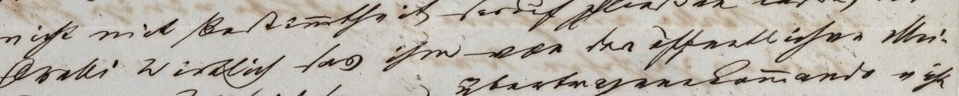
Orelli wirklich das ihm von der öffentlichen Mei-
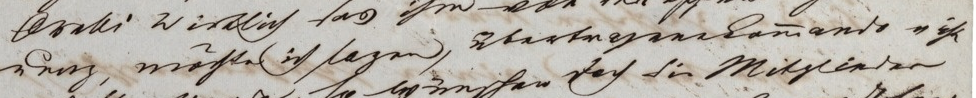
nung, möchte ich sagen, übertragene Commando nicht
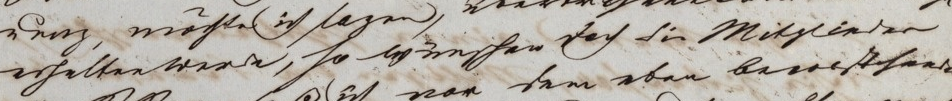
erhalten werde, so wünschen doch die Mitglieder
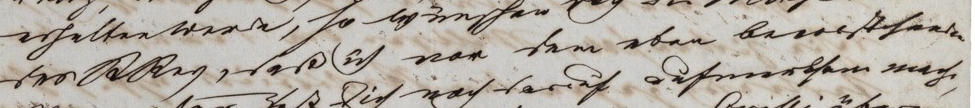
des RRes, daß ich vor dem eben bevorstehenden
